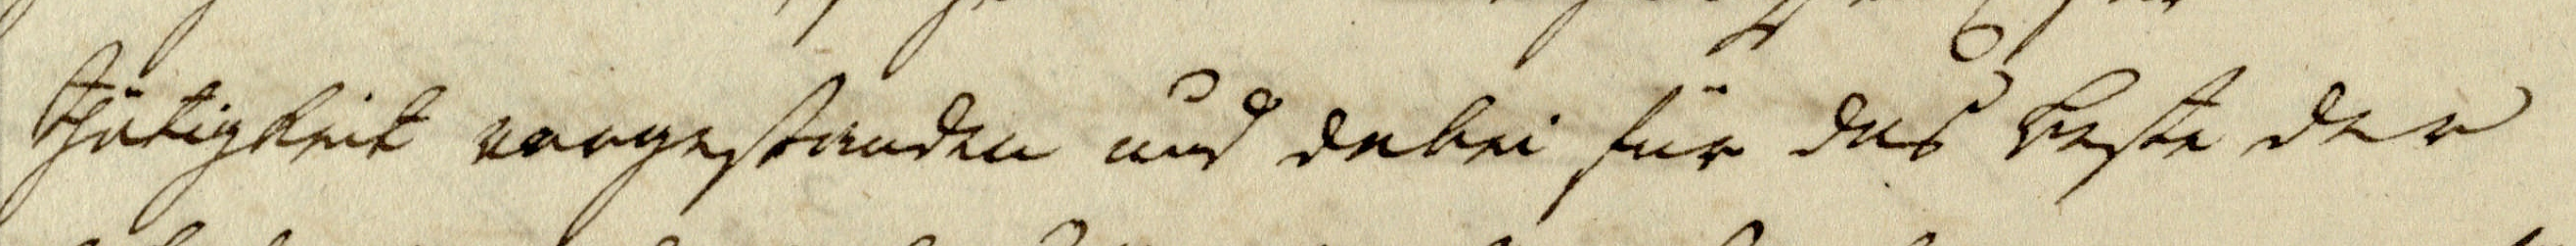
Thätigkeit vorgestanden und dabei für das Beste der
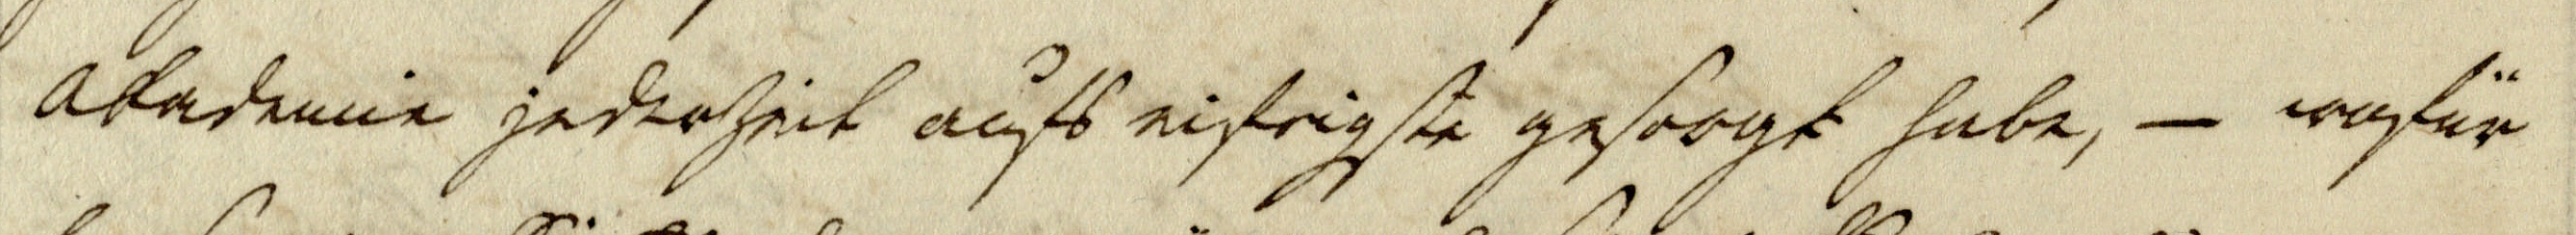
Akademie jederzeit aufs eifrigste gesorgt habe, wofür
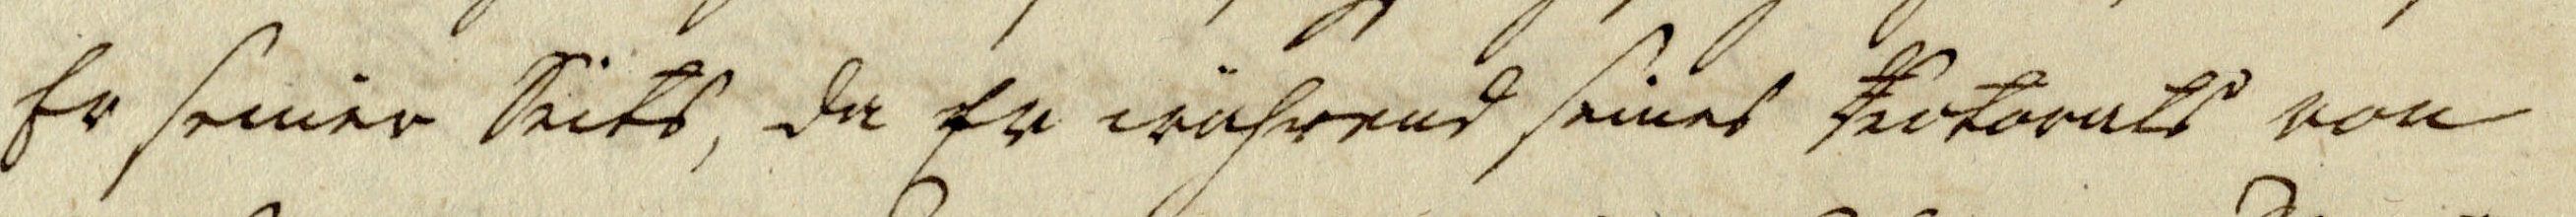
Er seiner Seits, da Er während seines Rectorats von
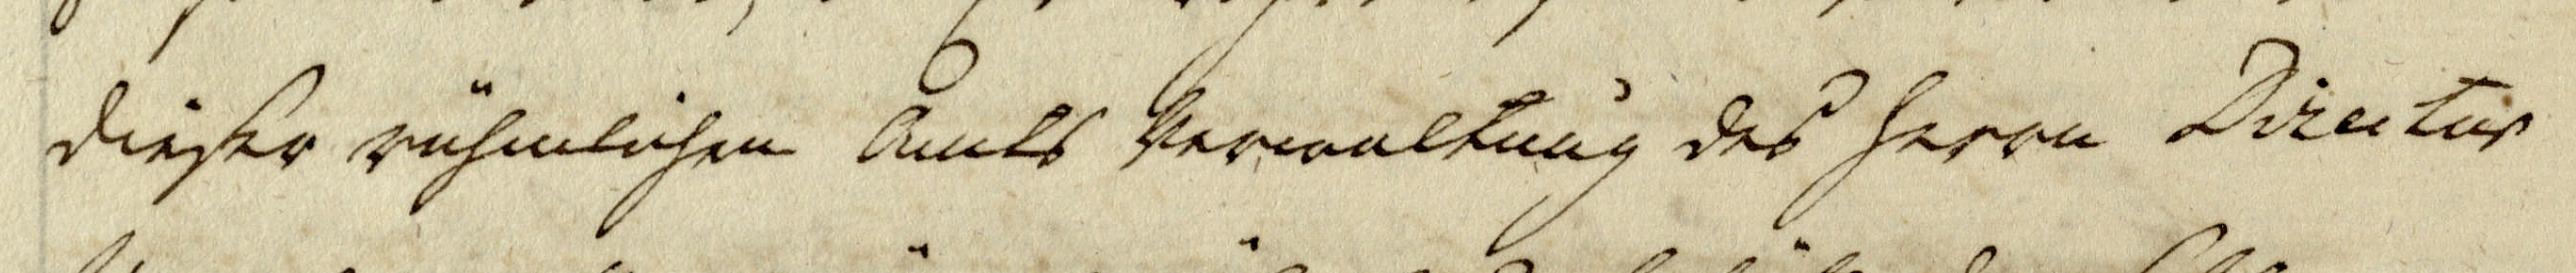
dieser rühmlichen Amts Verwaltung des Herrn Director
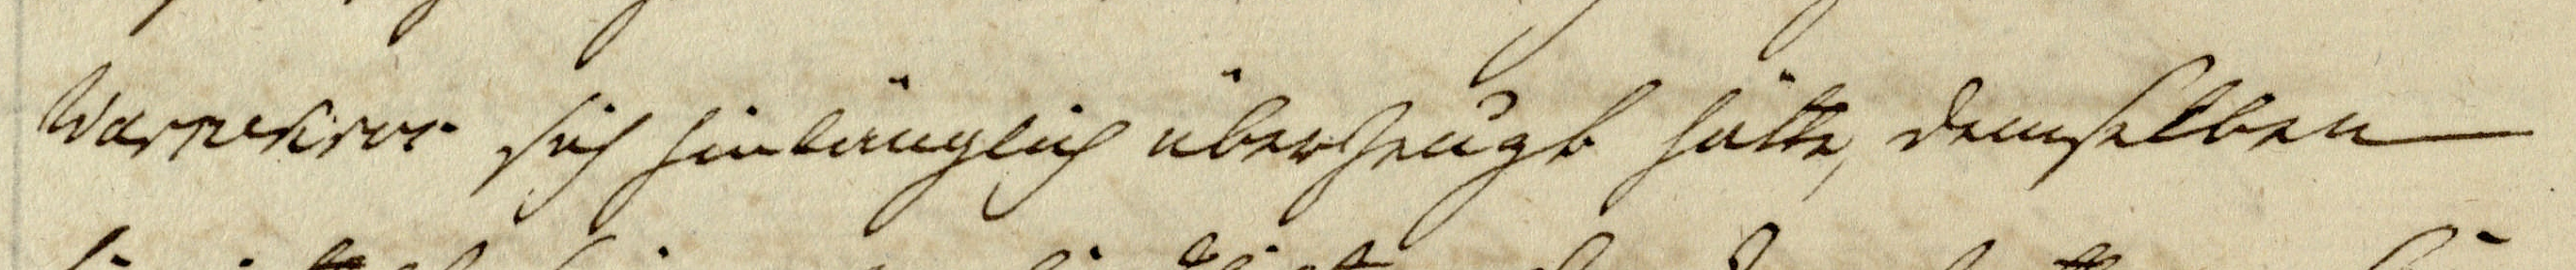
Warneckros sich hinlänglich überzeugt hätte, demselben
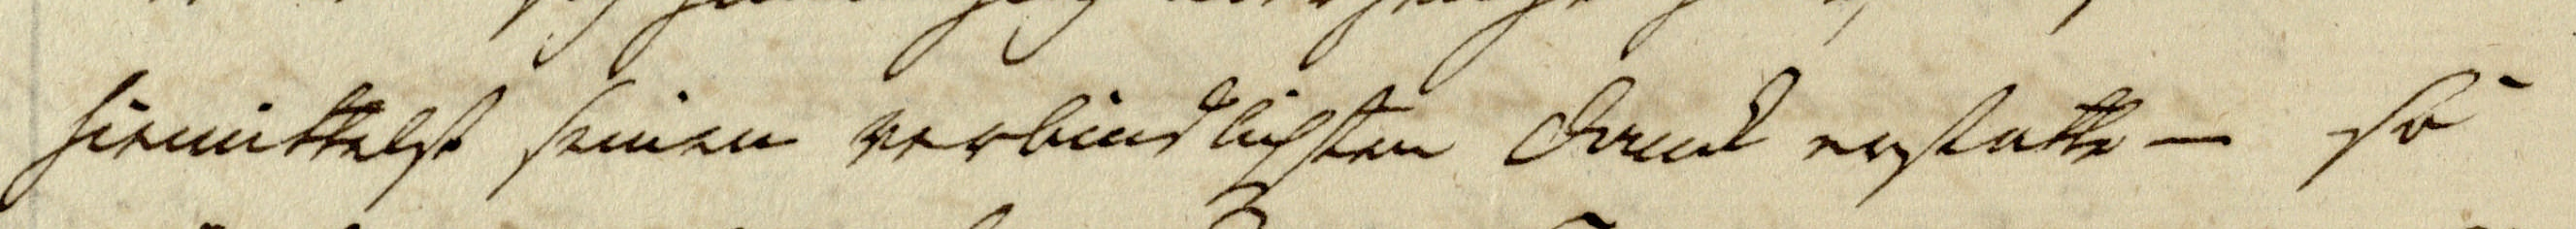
hiemittelst seinen verbindlichsten Danck erstatte so
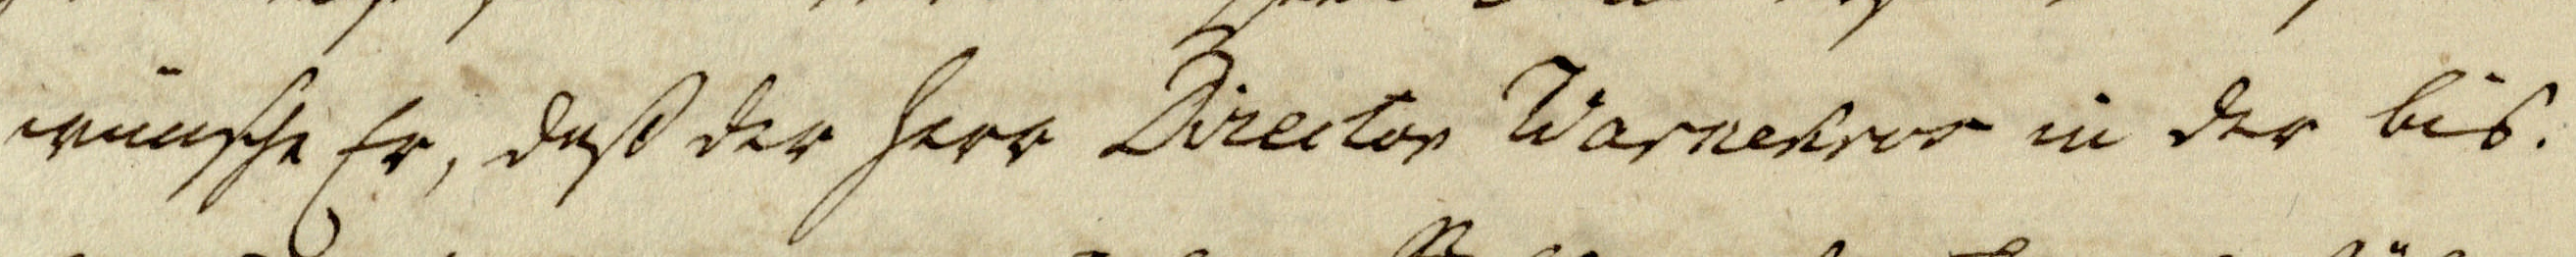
wünsche Er, daß der Herr Director Warnekros in der bis¬
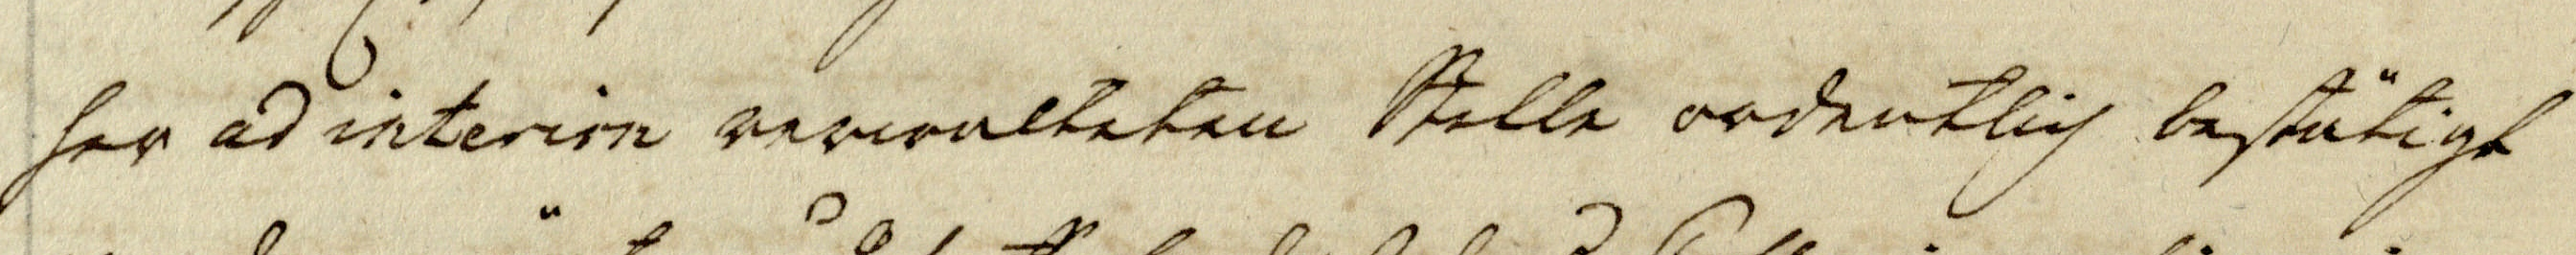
her ad interim verwalteten Stelle ordentlich bestätigt
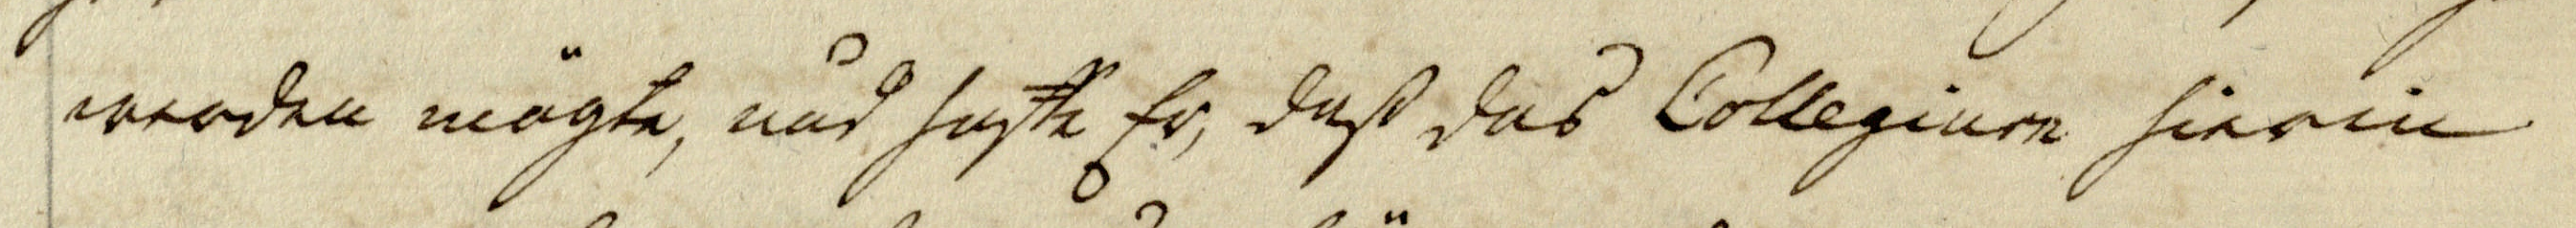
werden mögte, und hoffe Er, daß das Collegium hierin
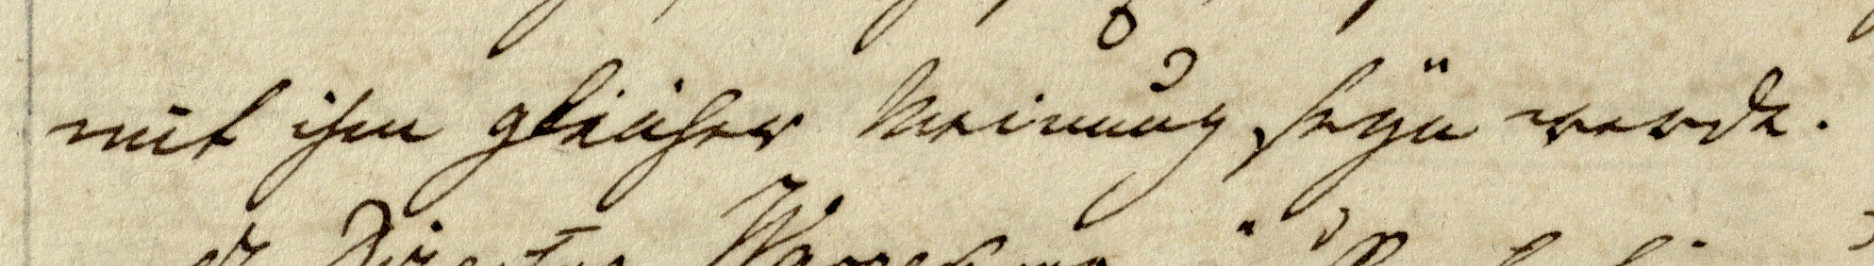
mit ihm gleicher Meinung seÿn werde.
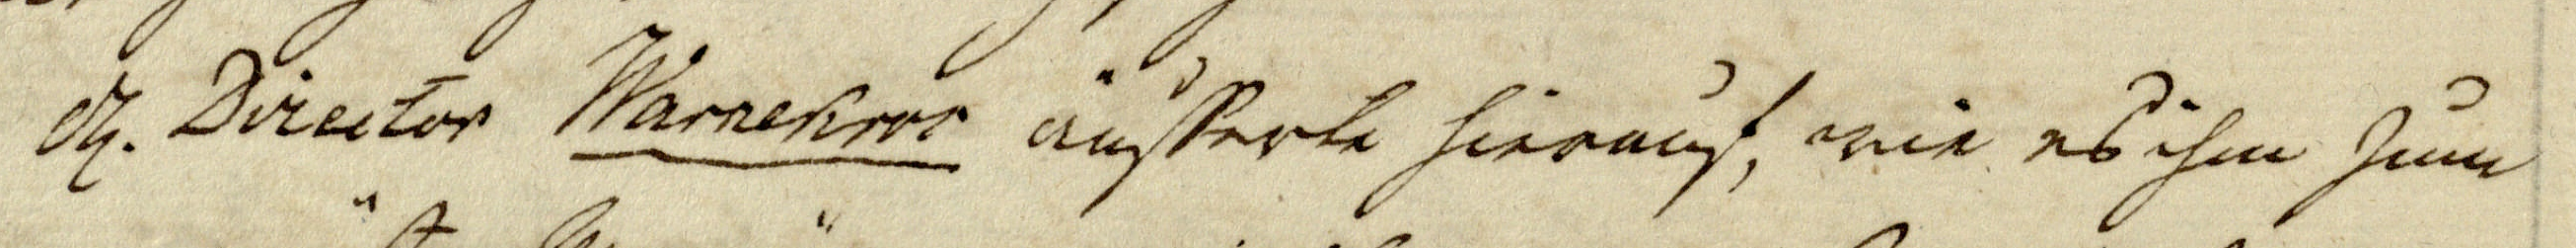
dh. Director Warnekros äusserte hierauf, wie es ihm zum
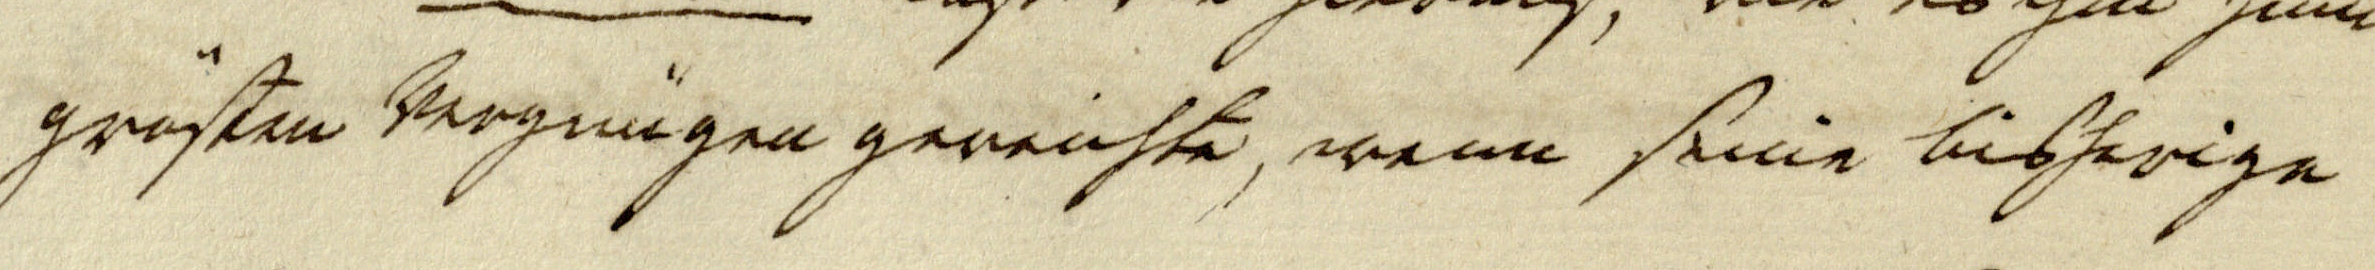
größten Vergnügen gereichte, wenn seine bisherige
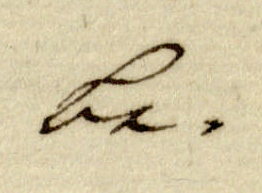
Be¬
